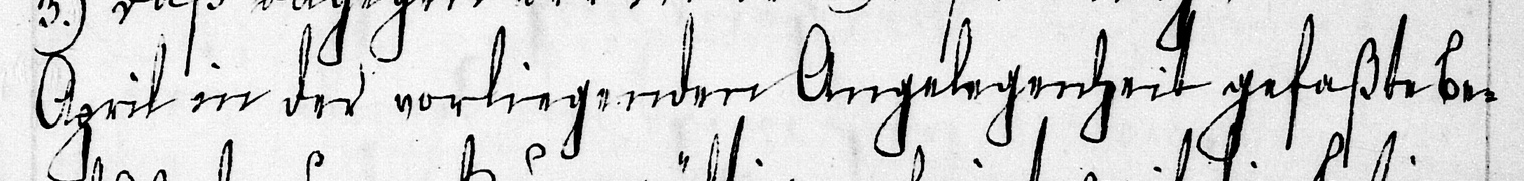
April in der vorliegenden Angelegenheit gefaßte Be¬
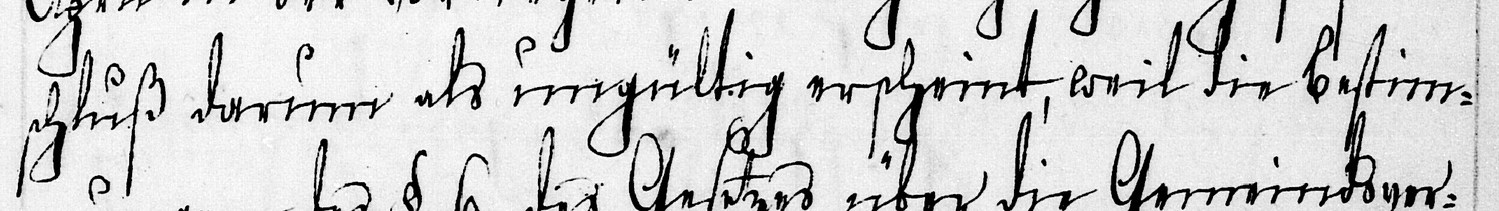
schluß darum als ungültig erscheint, weil die Bestim¬
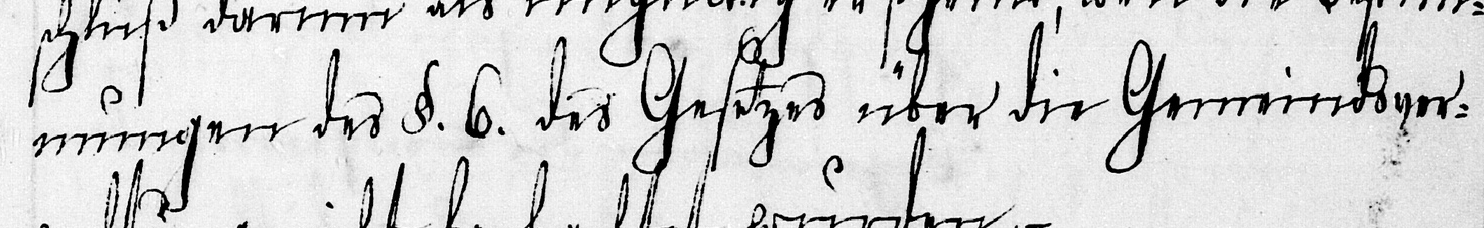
mungen des §. 6. des Gesetzes über die Gemeindsver¬
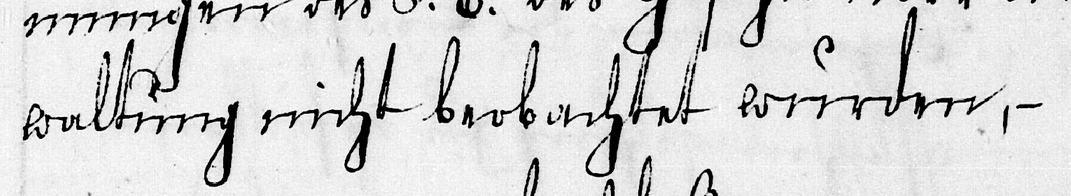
waltung nicht beobachtet wurden, –
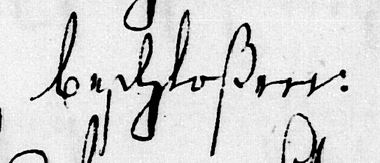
beschloßen:
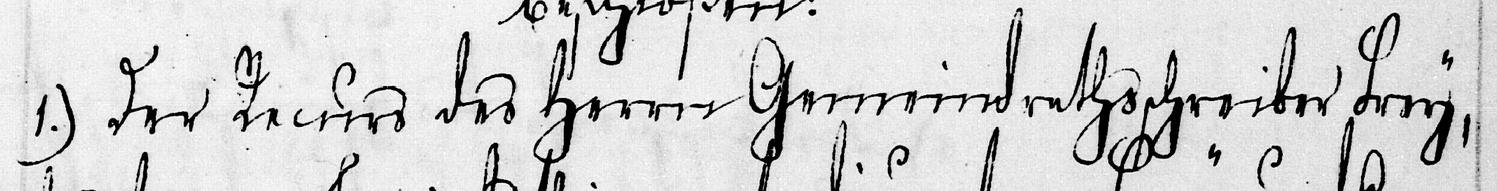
1.) Der Recurs des Herrn Gemeindrathsschreiber Frey,
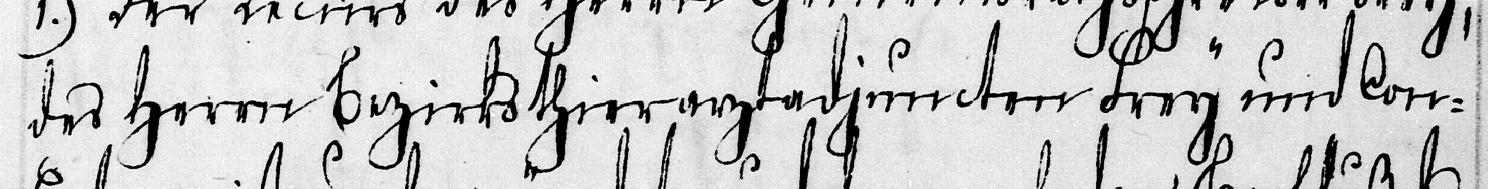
des Herrn Bezirksthierarztadjuncten Frey und Con¬
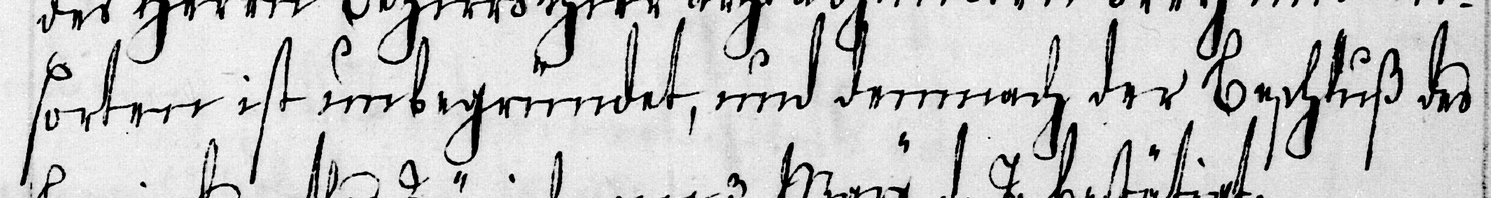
sorten ist unbegründet, und demnach der Beschluß des
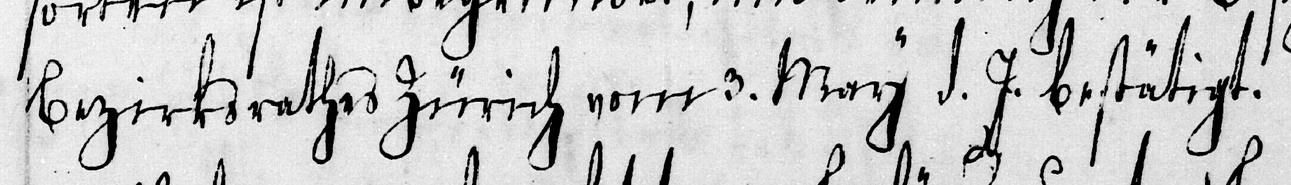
Bezirksrathes Zürich vom 3. May d. J. bestätigt.
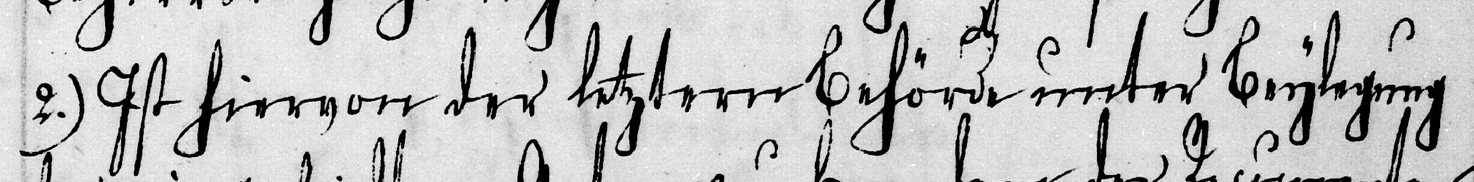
2.) Ist hiervon der letztern Behörde unter Beylegung
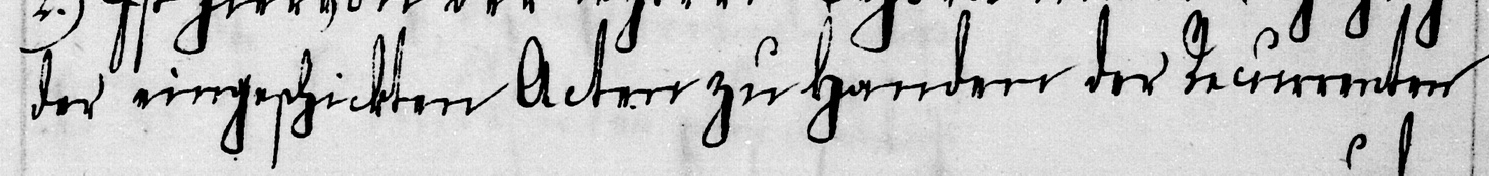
der eingeschickten Acten zu Handen der Recurrenten
